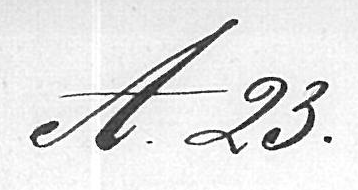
A. 23.
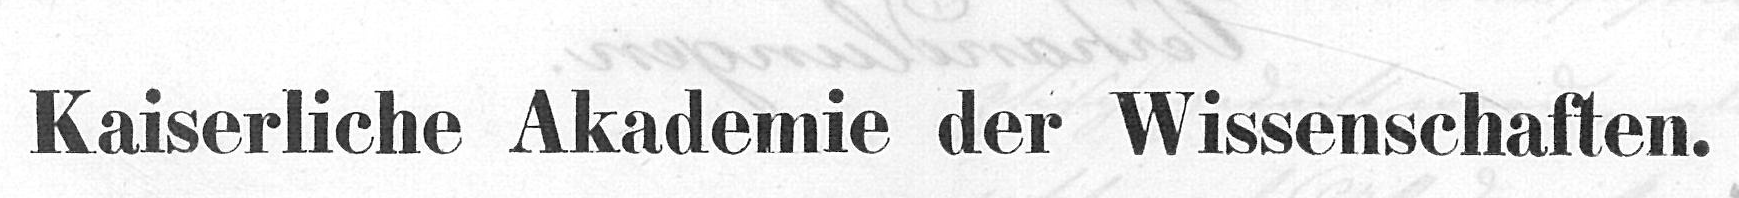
Kaiserliche Akademie der Wissenschaften.
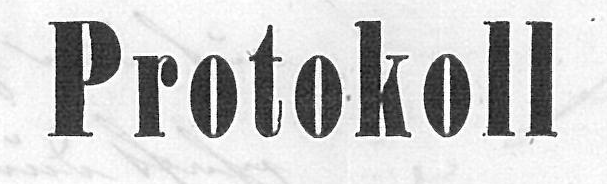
Protokoll
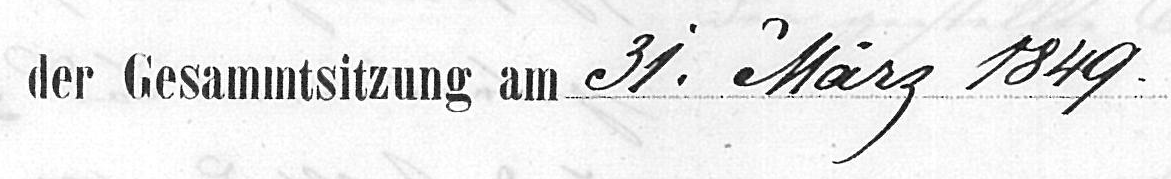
der Gesammtsitzung am 31. März 1849.
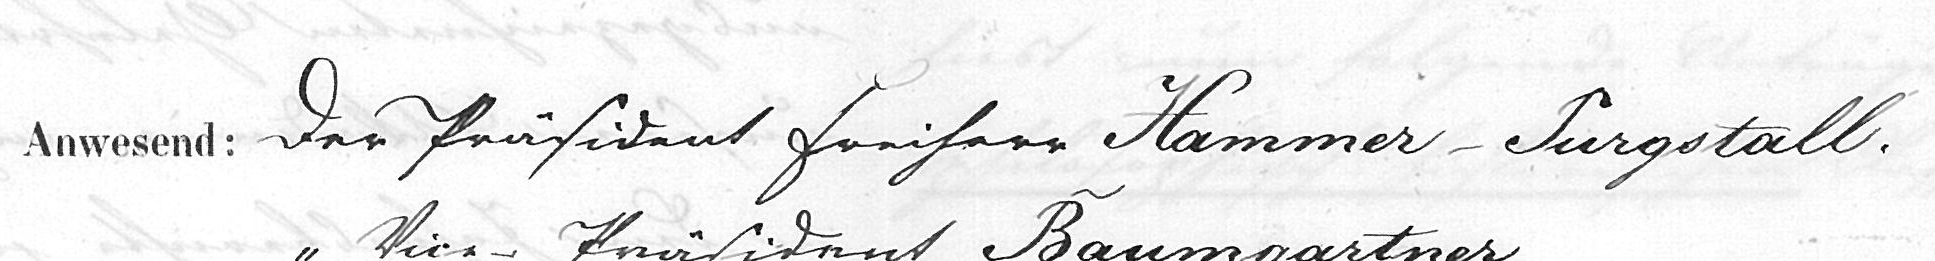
Anwesend: Der Präsident Freiherr Hammer-Purgstall.
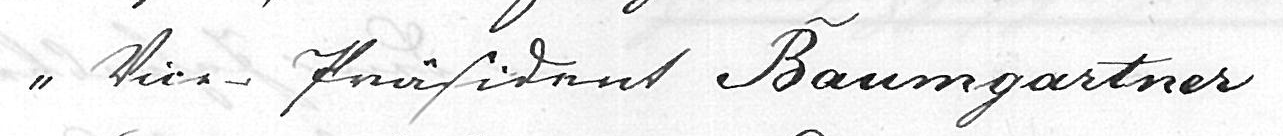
" Vice-Präsident Baumgartner
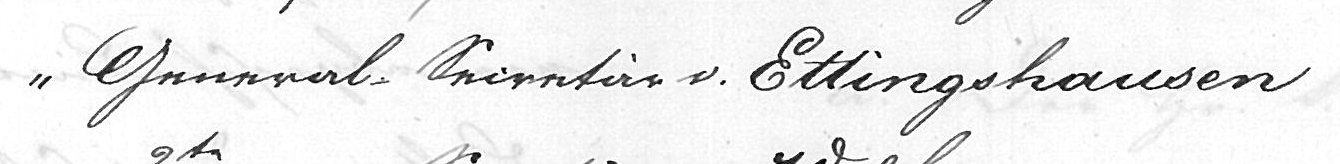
" General-Secretär v. Ettingshausen
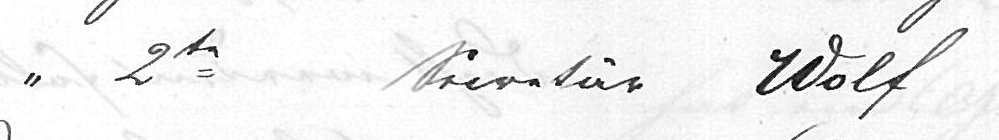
" 2te Secretär Wolf
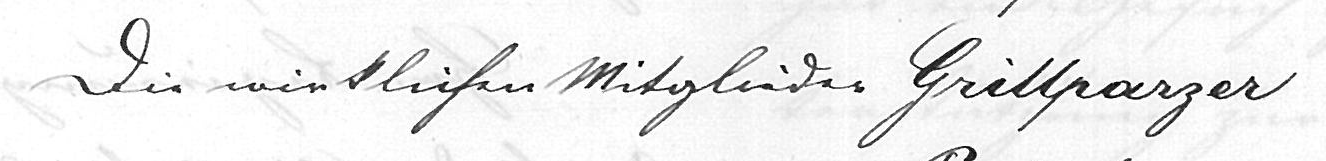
Die wirklichen Mitglieder Grillparzer
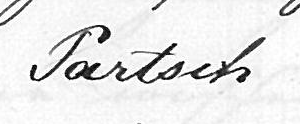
Partsch
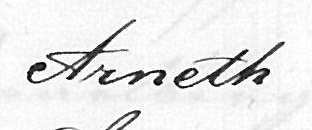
Arneth
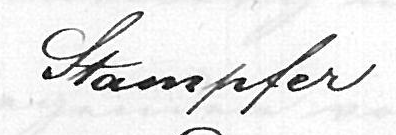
Stampfer
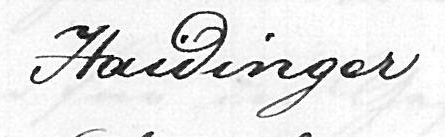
Haidinger
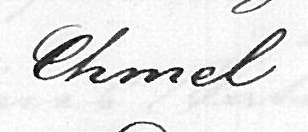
Chmel
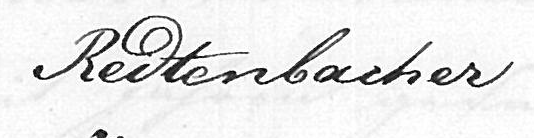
Redtenbacher
